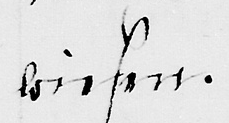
rwiesen.
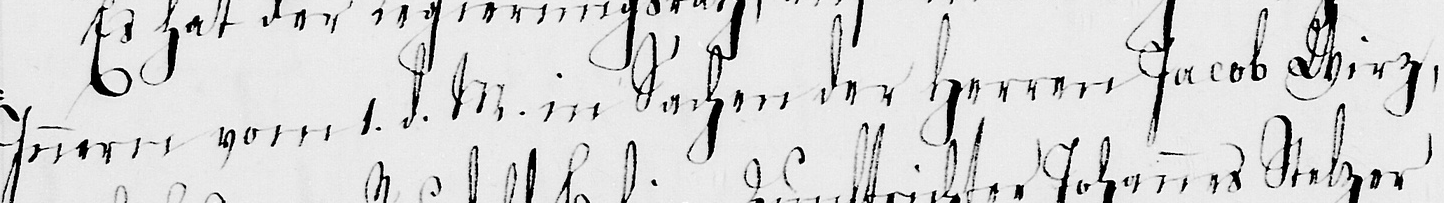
Innern vom 1. d. M. in Sachen der Herren Jacob Wirz,
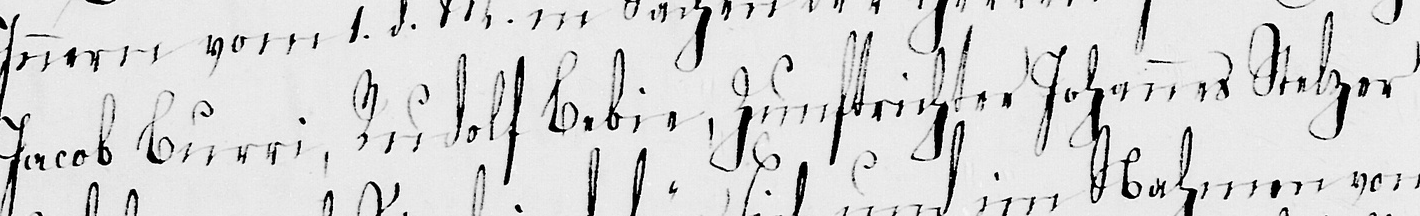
Jacob Burri, Rudolf Bebie, Zunftrichter Johannes Stelzer
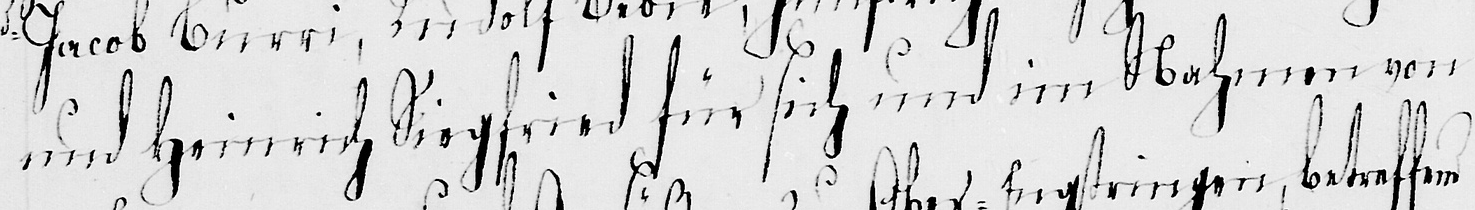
und Heinrich Siegfried für sich und im Nahmen von
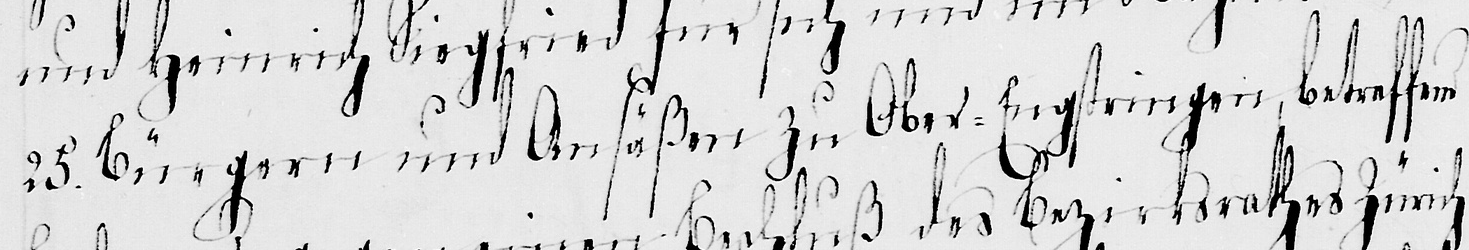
25. Bürgern und Ansäßen zu Ober-Engstringen, betreff¬
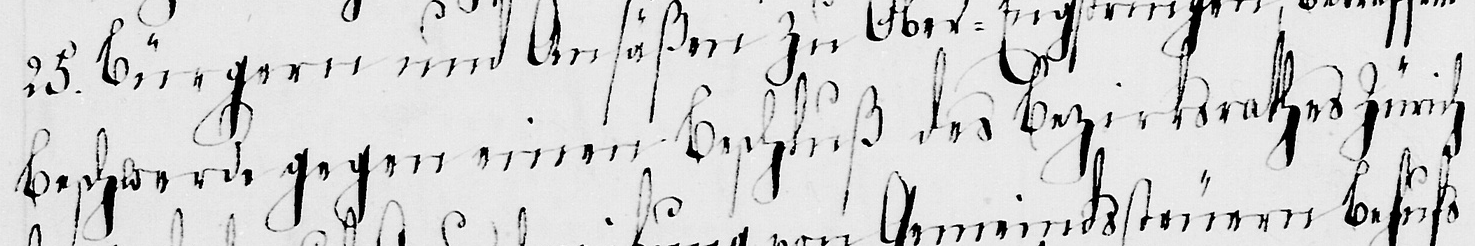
Beschwerde gegen einen Beschluß des Bezirksrathes Zürich
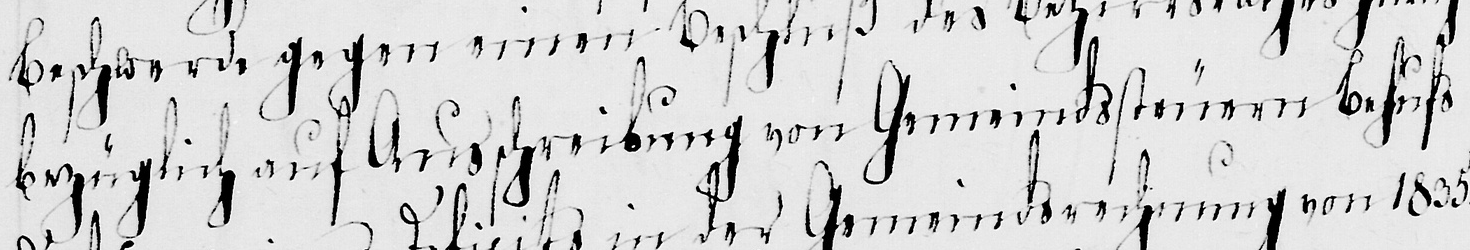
bezüglich auf Ausschreibung von Gemeindssteuern Behufs
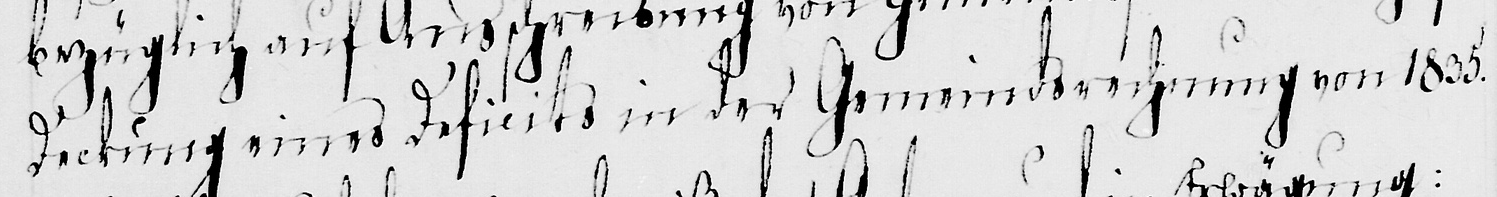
Deckung eines Deficits in der Gemeindsrechnung von 1835.
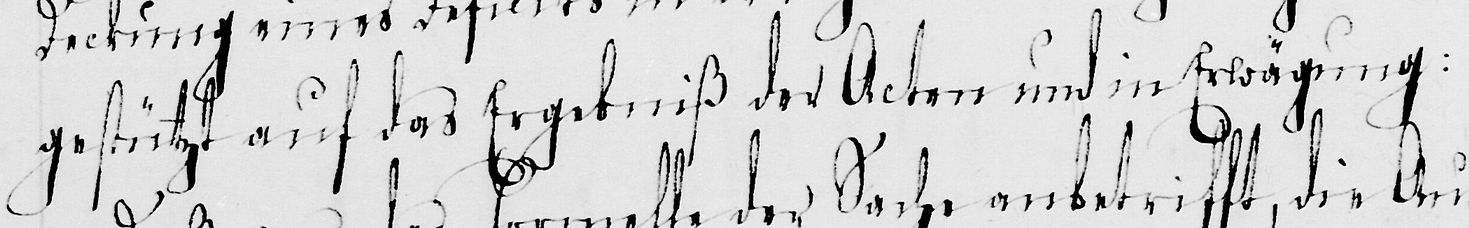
gestützt auf das Ergebniß der Acten und in Erwägung:
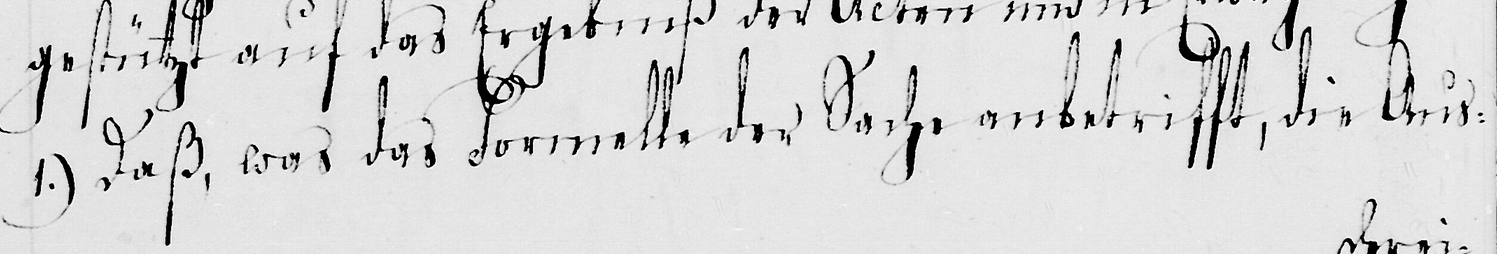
1.) Daß, was das Formelle der Sache anbetrifft, die Aus-
